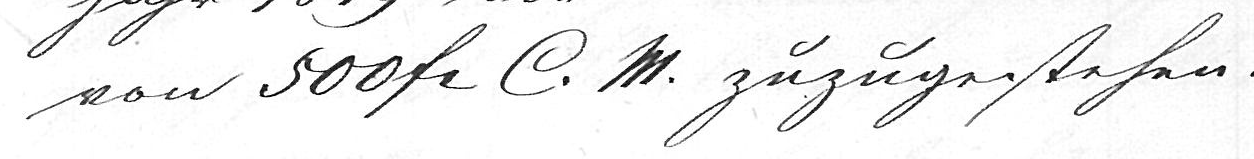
von 500 fl C.M. zuzugestehen.
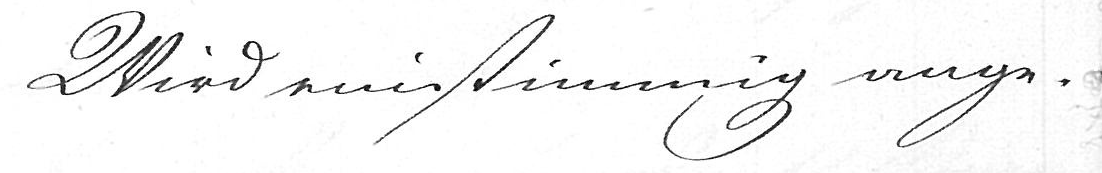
Wird einstimmig ange-
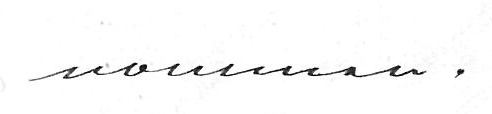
nommen.
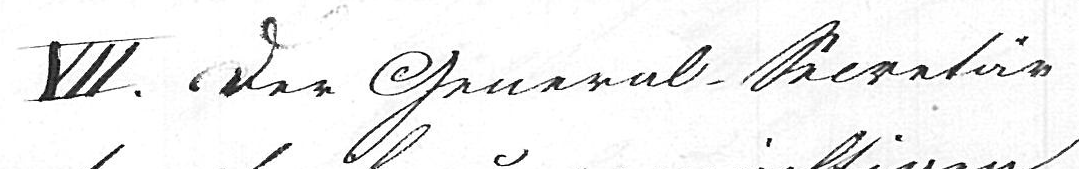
VII. Der General-Secretär
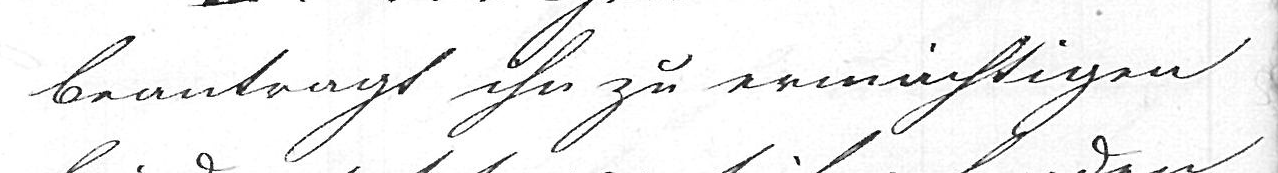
beantragt ihn zu ermächtigen
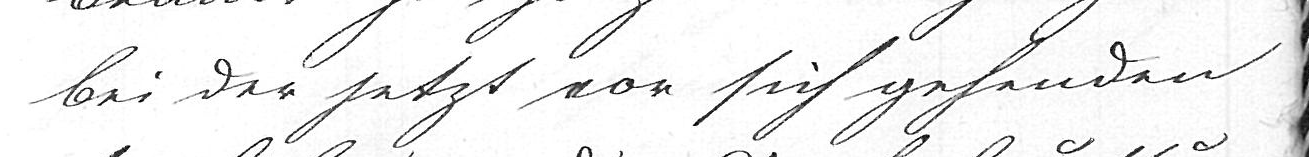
bei der jetzt vor sich gehenden
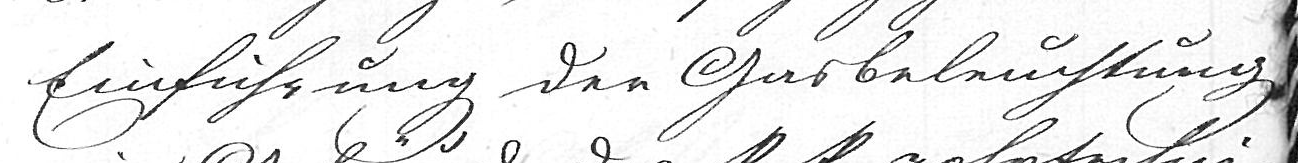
Einführung der Gasbeleuchtung
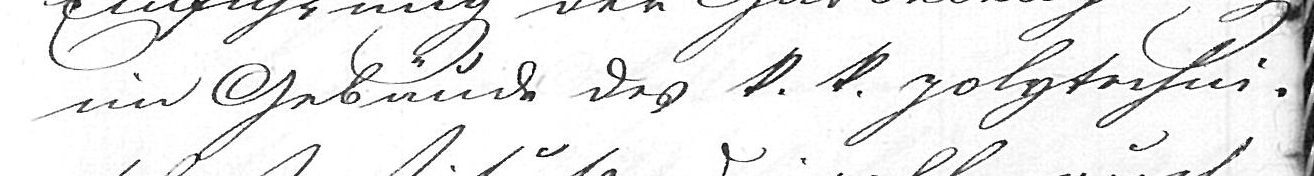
in Gebäude des k. k. polytechni-
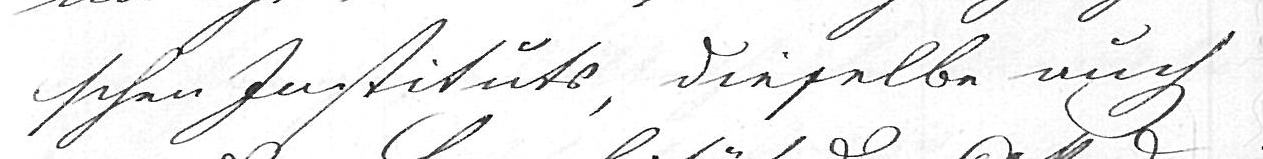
schen Instituts, dieselbe auch
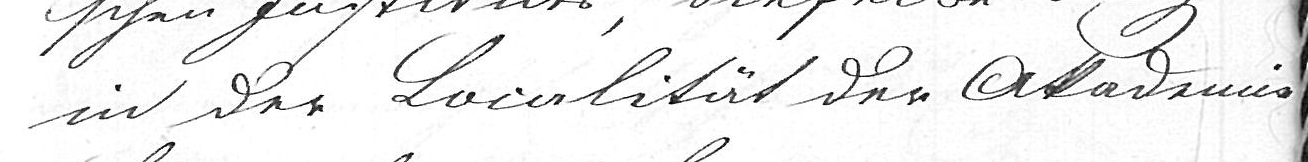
in der Localität der Akademie
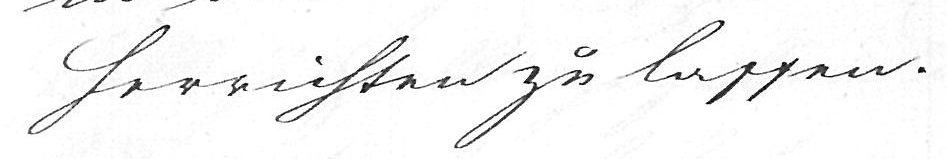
herrichten zu lassen.
